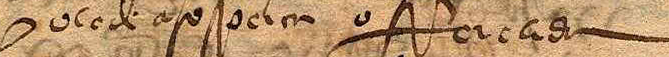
Ꝓocede a sospeiçā offerecida
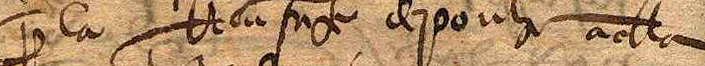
p̄la Recusāte deponha a ella
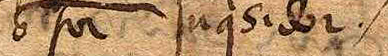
o s̄or Jnqisidor ./
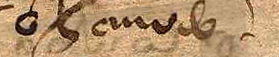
themudo
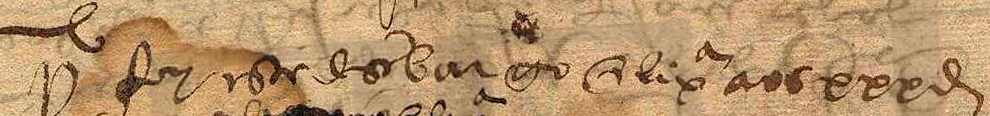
Pdo foy este desēbargo ē lixa aos xxx dj
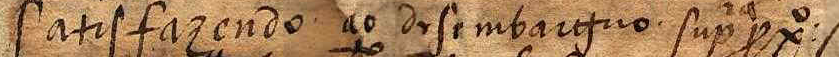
satisfazendo ao desembarguo supra ꝓxo./
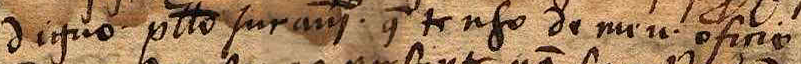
diguo pl̄lo Juramto. q̄ tenho de meu oficio
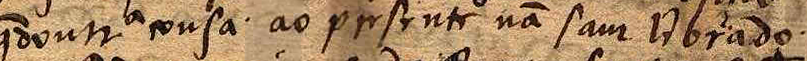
q̄ doutra cousa. ao presente nā sam lēbrado
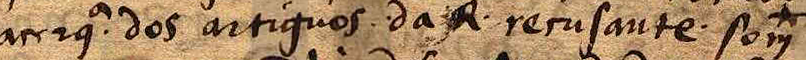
acerqa. dos artiguos da .R. recusante. somte
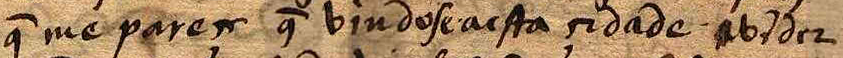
q̄ me parece q̄ vindose a esta cidade a vēder
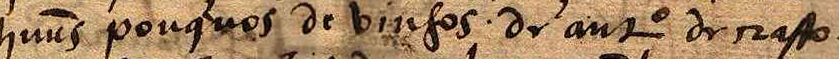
huūs pouquos de vinhos. de anto de crasto
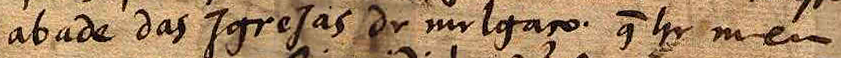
abade das JgreJas de melgaço. q̄ he meu
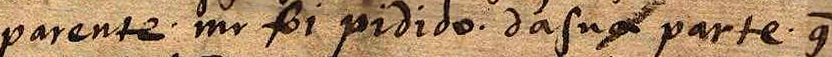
parente. me foi pidido da sua parte. q̄
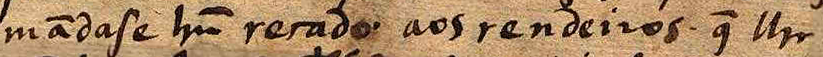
mādase hū recado aos rendeiros q̄ lhe
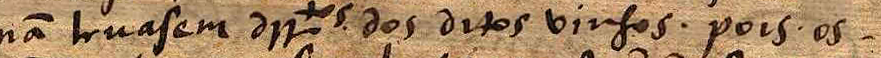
nā leuasem drrtos dos ditos vinhos. pois os
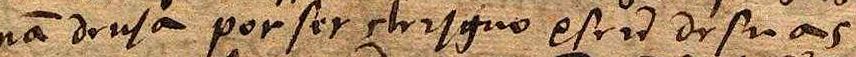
nā deuja por ser clerjguo e serē de suas
